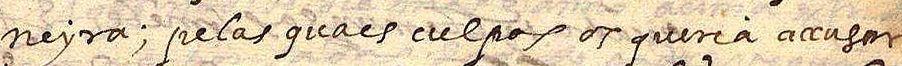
neyra; pelas quaes culpas os queria accusar
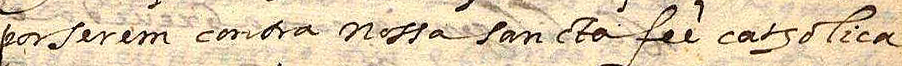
por serem contra nossa sancta feé catholica
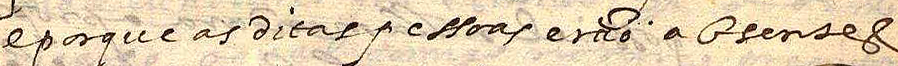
e porque as ditas pessoas eraõ absentes
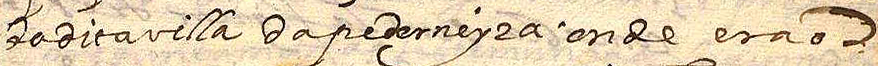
da dita villa da pederneyra onde eraõ
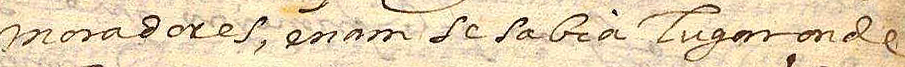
moradores, e nam se sabia Lugar onde
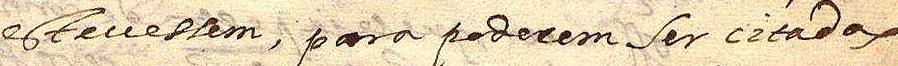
esteuessem, para poderem ser citadas
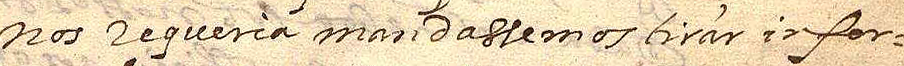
nos Requeria mandassemos tirar infor
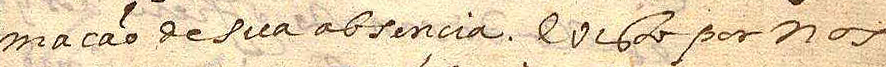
maçaõ de sua absençia. e visto por nos
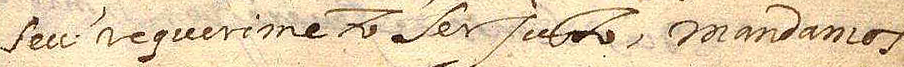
seu requerimēto ser Justo, mandamos
